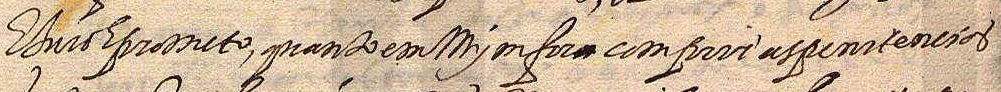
E Iuro E prometo, quanto em mym fora comprir as penitencias
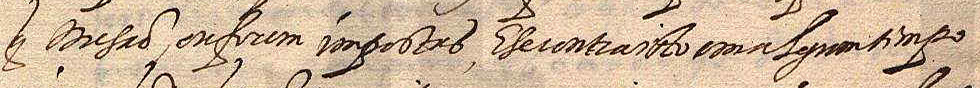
q̄ me saõ, ou forem impostas, E se contra isto em algum tempo
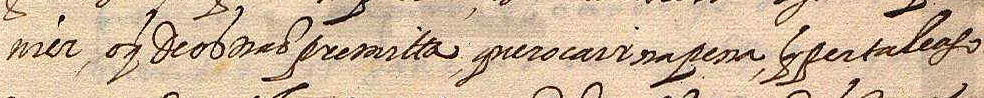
uier, o q̄ Deos naõ premitta, quero cair na pena, q̄ por tal caso
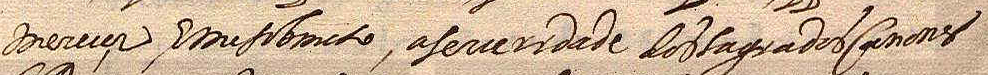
merecer, e me sobmeto, a seueridade dos sagrados Canones
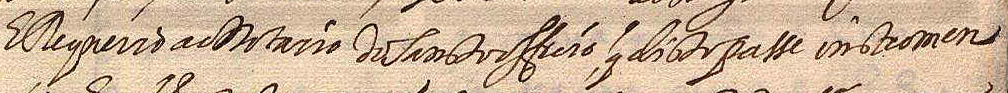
E Requeiro ao Notario do Sancto officio, q̄ disto passe instromen
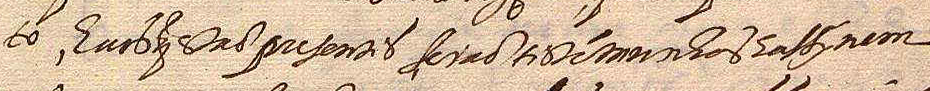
to, E aos q̄ estaõ presentes seraõ testemunhas E assy nem
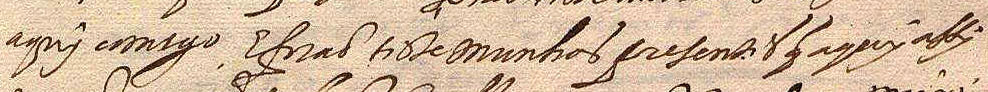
aquj comigo, E foraõ testemunhas presentes q̄ aquy assj
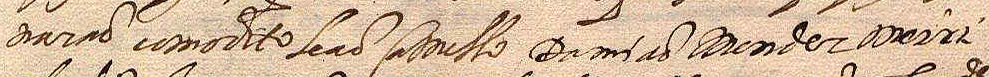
naraõ com o dito Leaõ Camello Damião mendez meiri
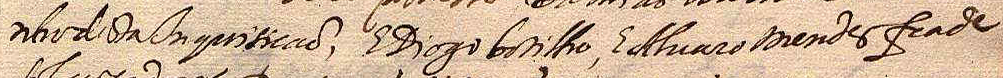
nho desta Inquisiçaõ, E Diogo botilho, e Aluaro Mendes frade
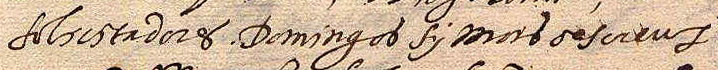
solicitadores. Domingos symois̄ o escreuj
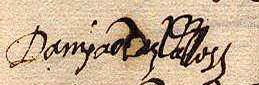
Damiaõ _ez Vallos
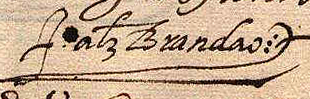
J.o al̄z Brandaõ
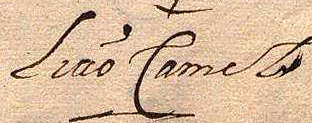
Liaõ Camelo
